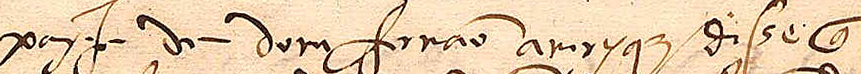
payJe de dom fernão amryqz / disse q̄
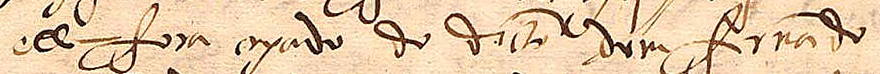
elle fora cryado do dīcto dom fernādo
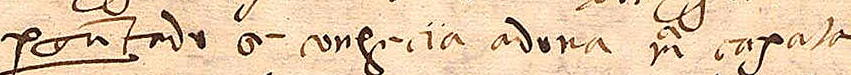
ꝑgūtado se conhecia a dona ma casada
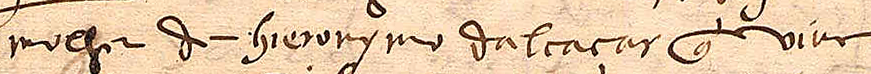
molher de hieronymo dalcaçar q̄ viue
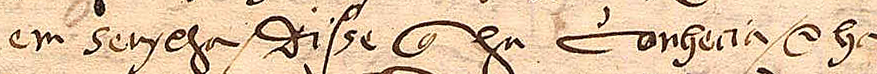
em seuylha / Disse q̄ ha conhecia / e ha
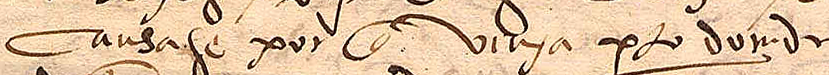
Causa he porq̄ viuya ꝑto domde
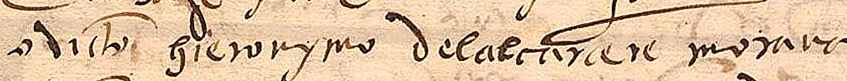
o dīcto hieronymo del alcarcere moraua
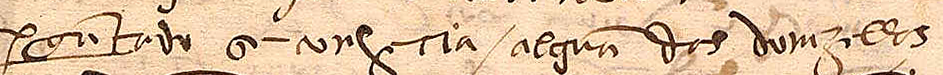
ꝑgūtado se conhecia / algūa das domzellas
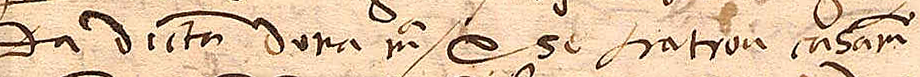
da dīcta dona ma / e se tratrou casamto
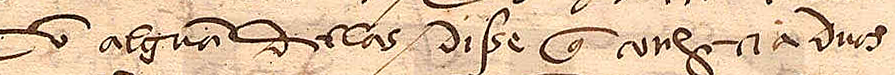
Cō algūa dellas / disse q̄ conhecia duas
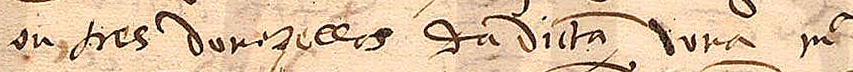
ou tres domzellas da dīcta dona ma
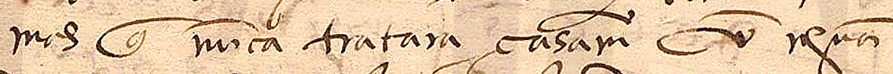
mas q̄ nūca tratara casamto Cō nhūa
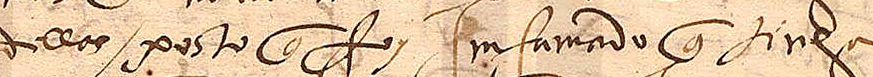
dellas / posto q̄ foy Jmfamado q̄ tinha
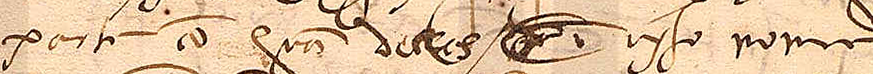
parte cō hūa dellas / CuyJo nome
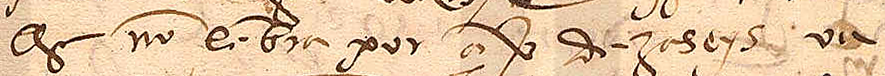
lhe nō lēbra por aꝟ dezaseys ou
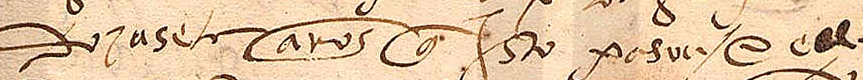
dezasete ānos q̄ Jsto pasou / e elle
